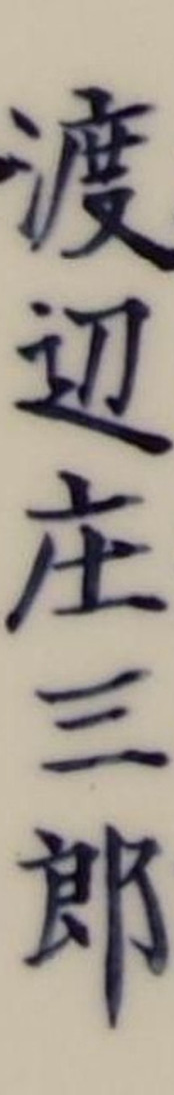渡辺庄三郎
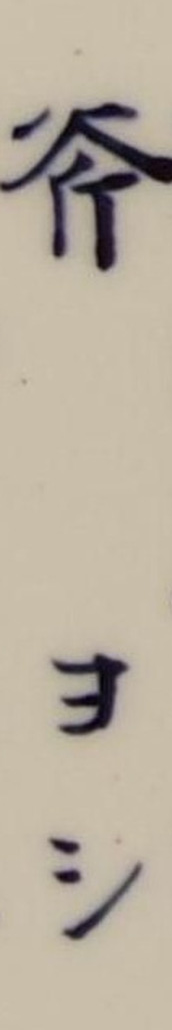斧ヨシ
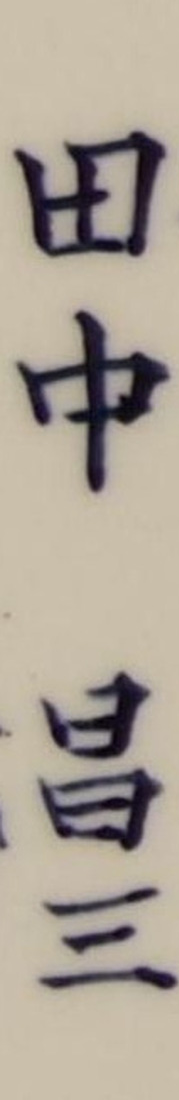田中昌三

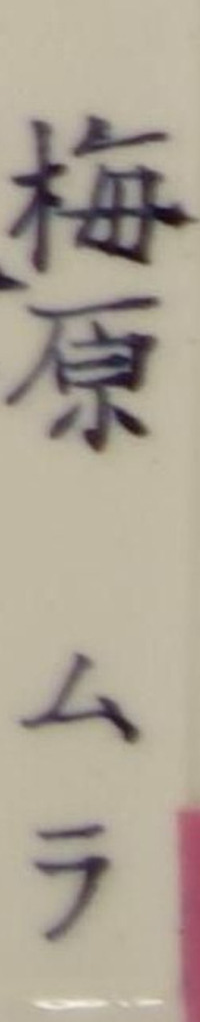梅原ムラ
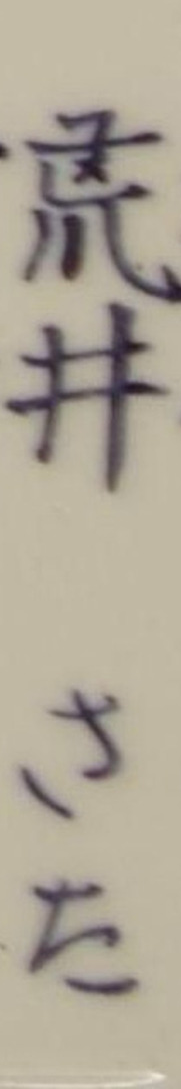荒井さた
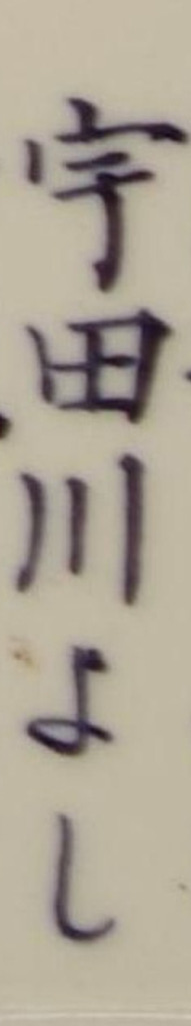宇田川よし
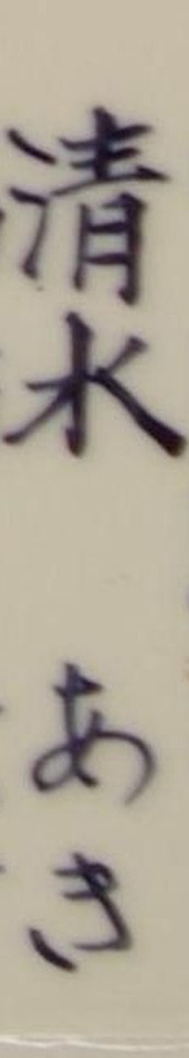清水あき
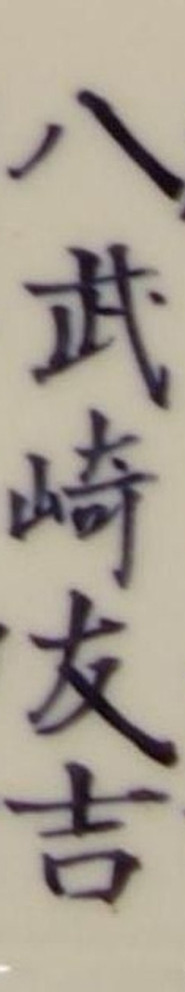八武崎友吉
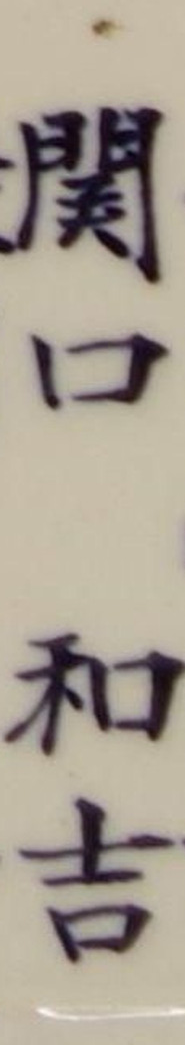関口和吉
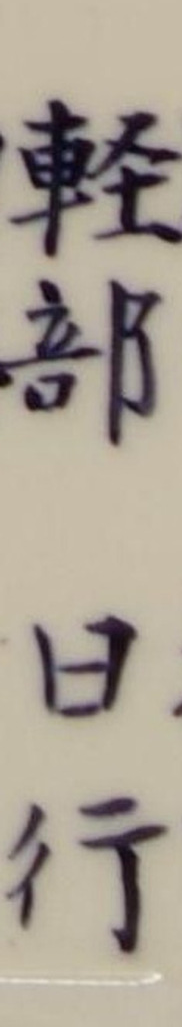軽部日行
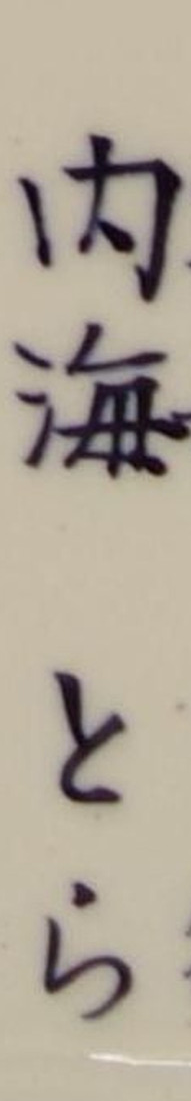内海とら
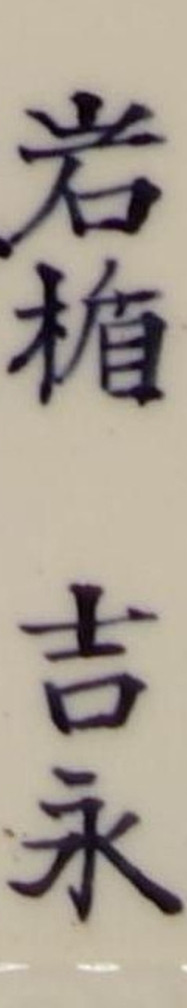岩楯吉永
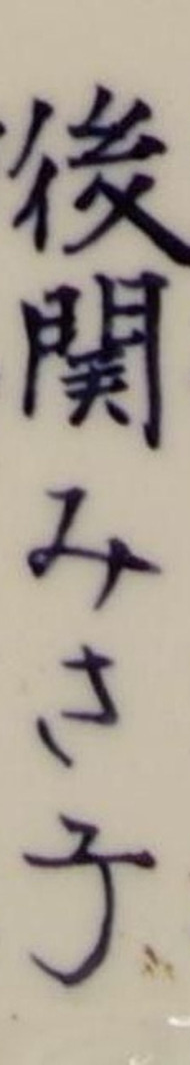後関みさ子
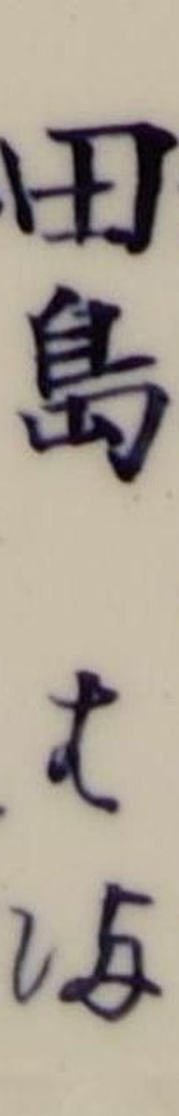田島はま
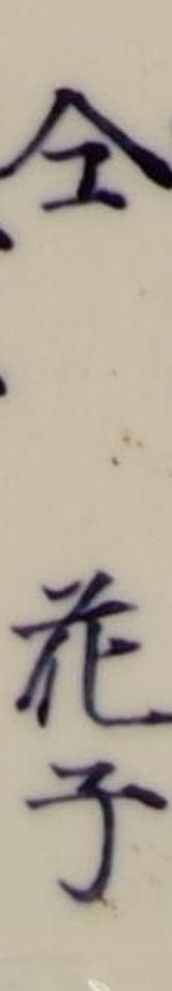仝花子
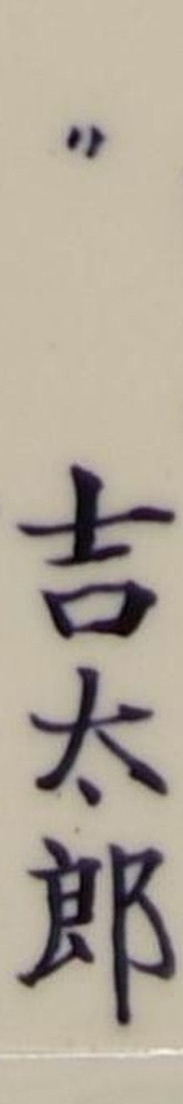吉太郎
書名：E~L
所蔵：高野山金剛峯寺
